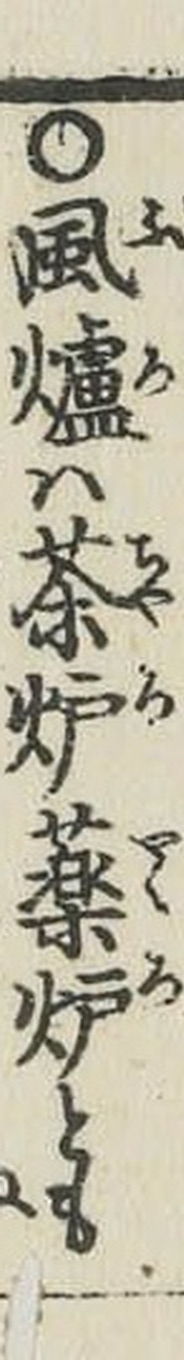○風炉は茶炉薬炉とも
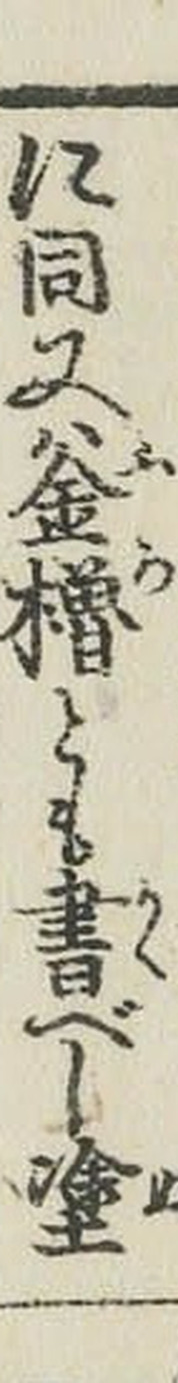に同又は釜櫓とも書べし塗
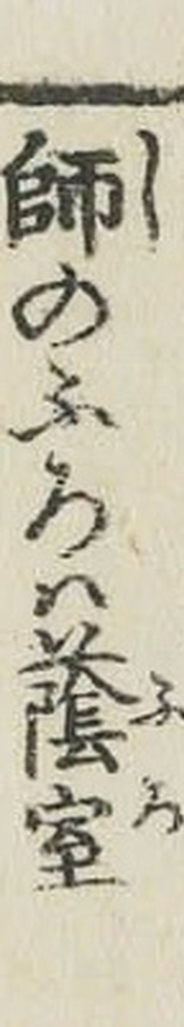師のふろは蔭室
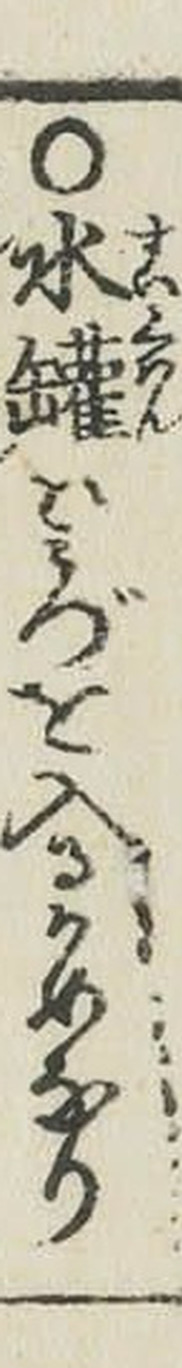○水罐はみづを入るかめなり
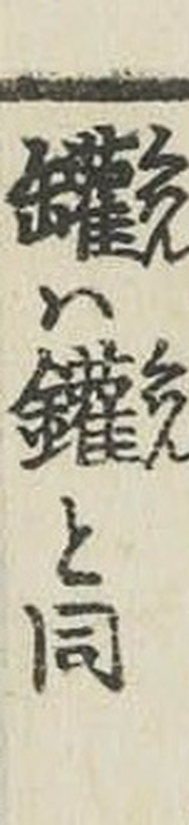罐は鑵と同
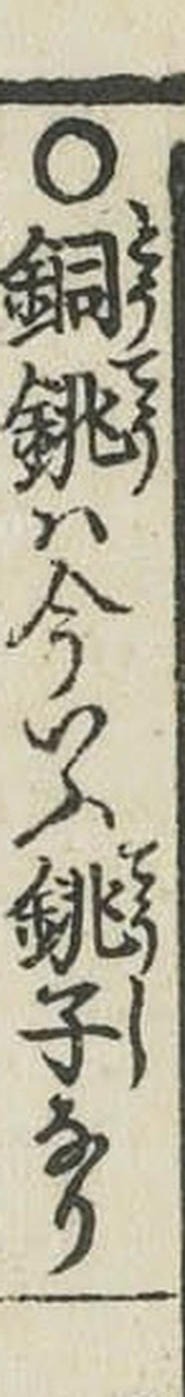○銅銚は今いふ銚子なり
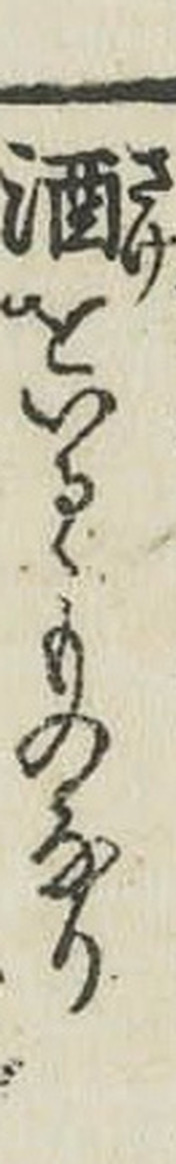酒をいるゝものなり
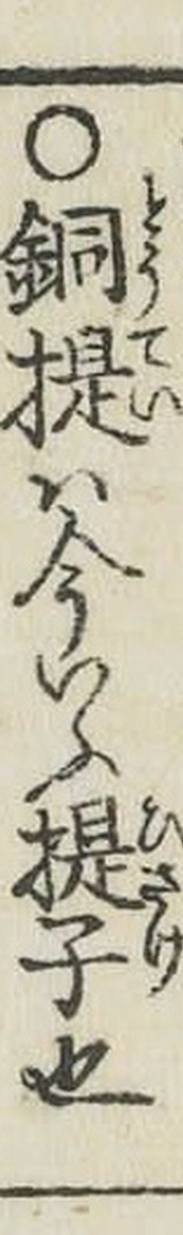○銅提は今いふ提子也
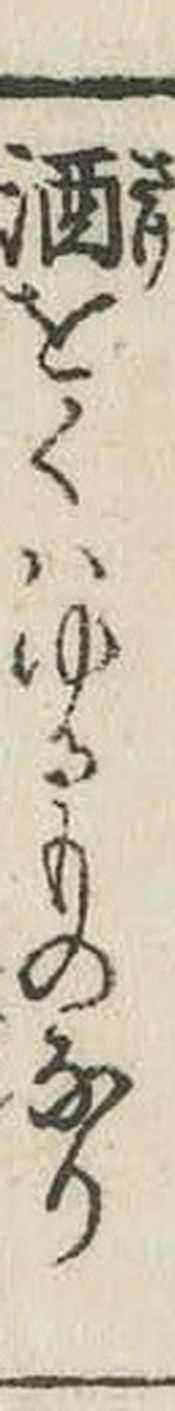酒をくはゆるものなり
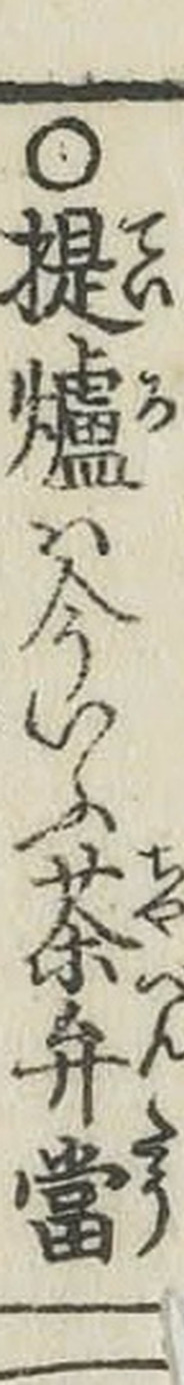○提炉は今いふ茶弁当
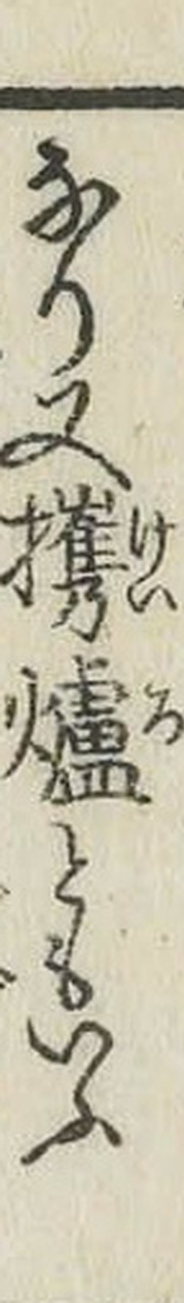なり又携炉ともいふ
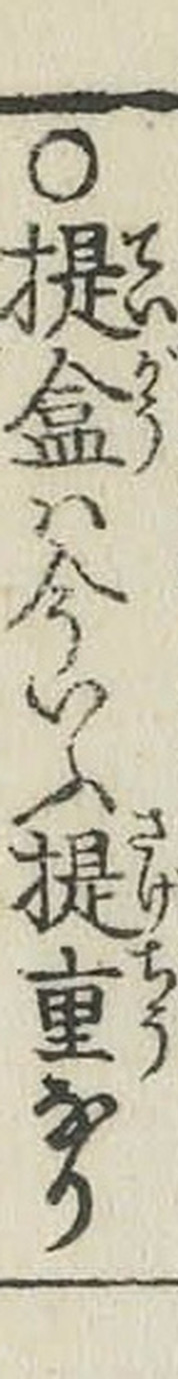○提盒は今いふ提重なり
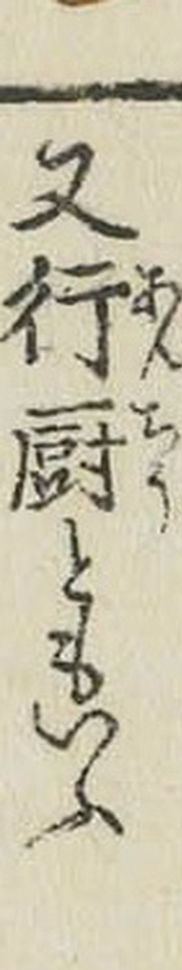又行厨ともいふ
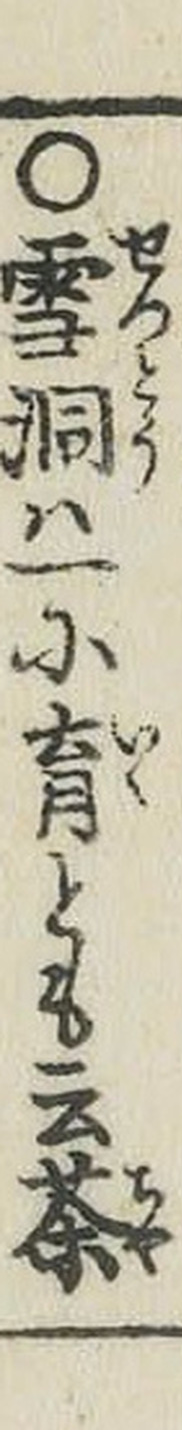○雪洞は一に育とも云茶
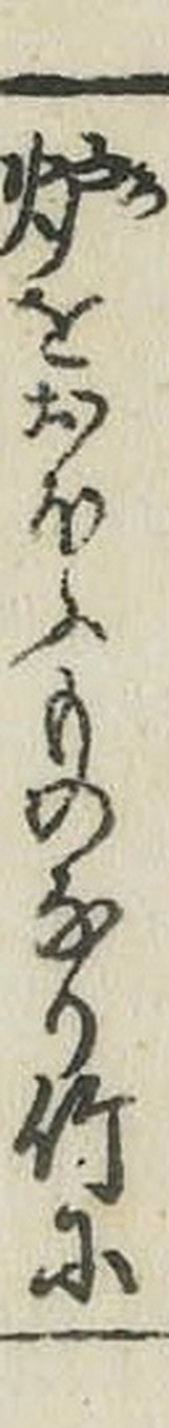炉をおほふものなり竹に
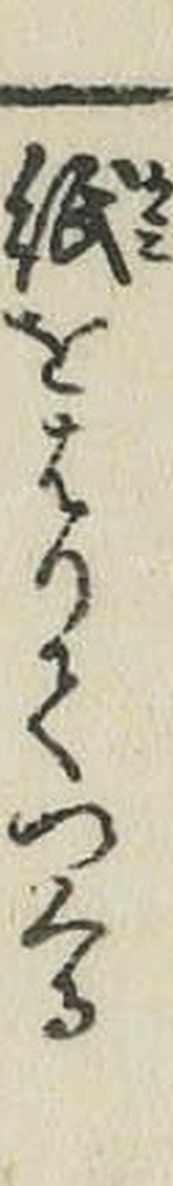紙をはりてつくる
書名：増補頭書訓蒙図彙大成 10巻 5:巻之9-11
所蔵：東京学芸大学教育コンテンツアーカイブ
